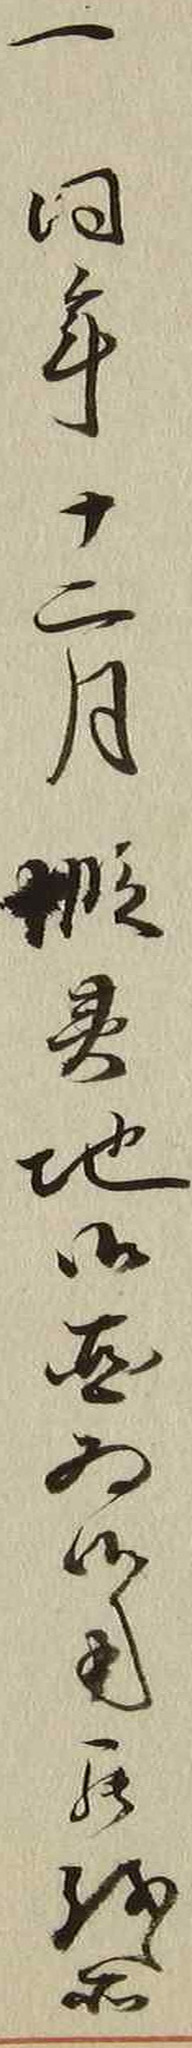一同年十二月蝦夷地御固為御用罷越候所
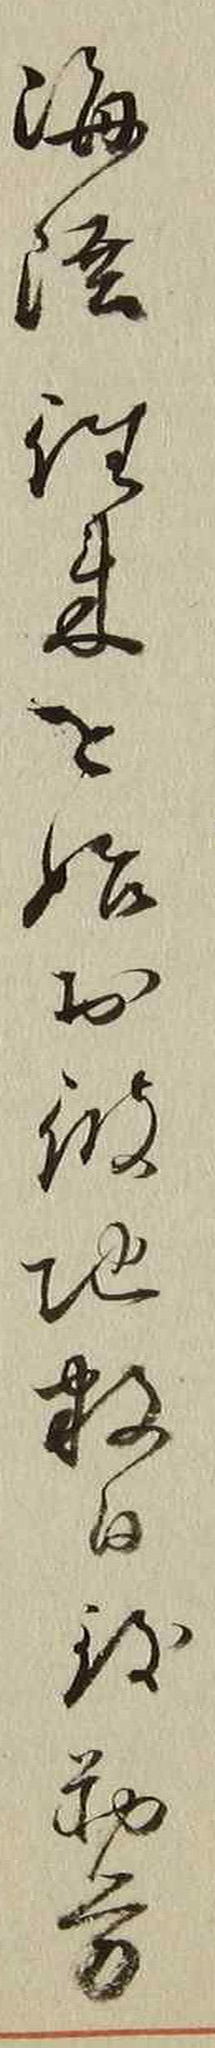海陸往来を始於彼地数日致勤労
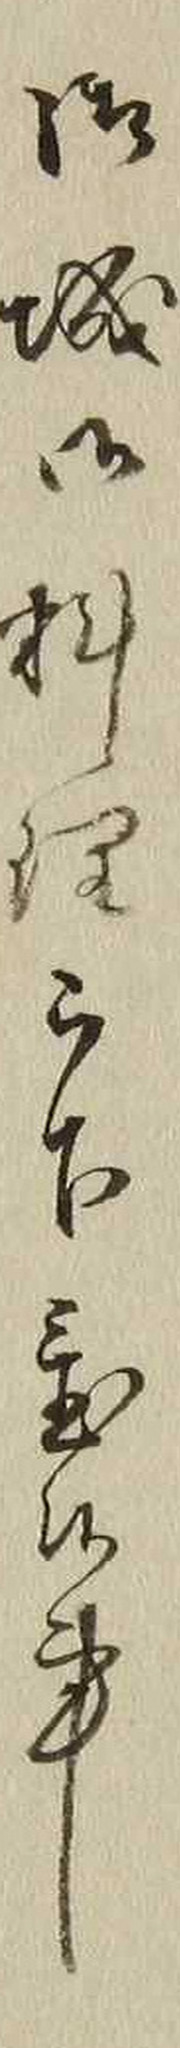御城御料理被下置候事
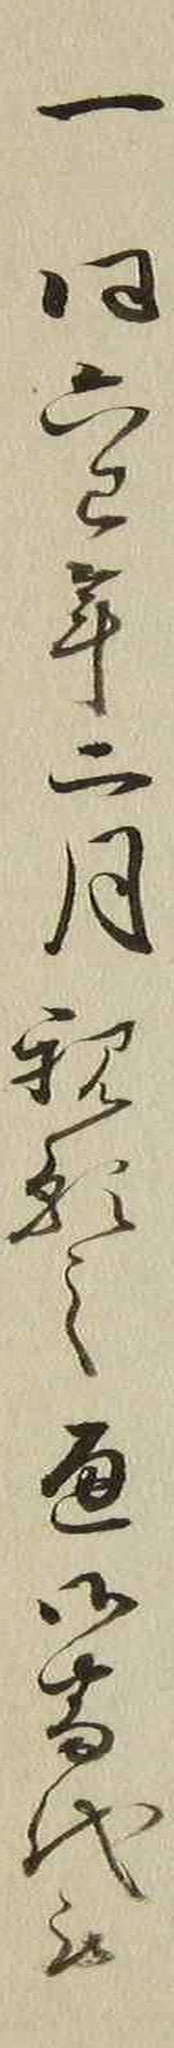一同六巳年二月親願之通御番代被
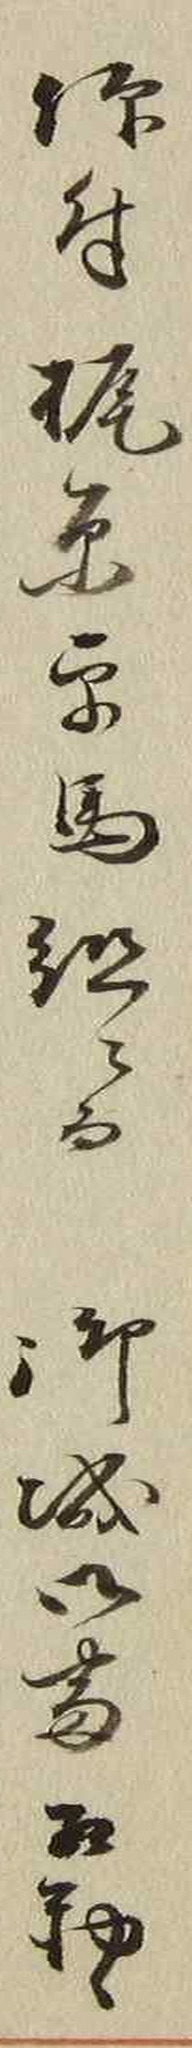仰付梶原平馬組ニ而御城御番相勤候
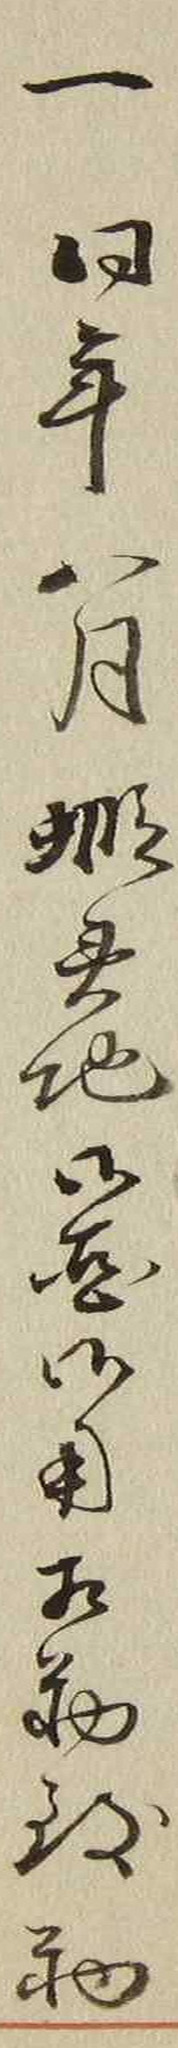一同年八月蝦夷地御固御用相勤致勤
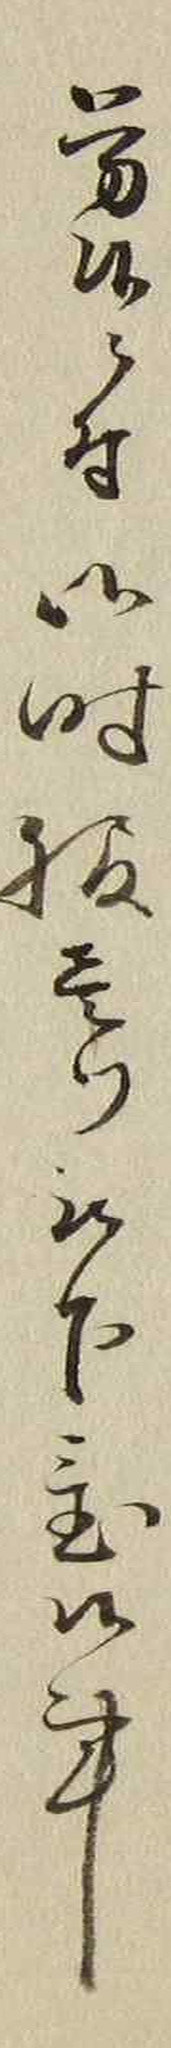労候ニ付御時服壱ツ被下置候事
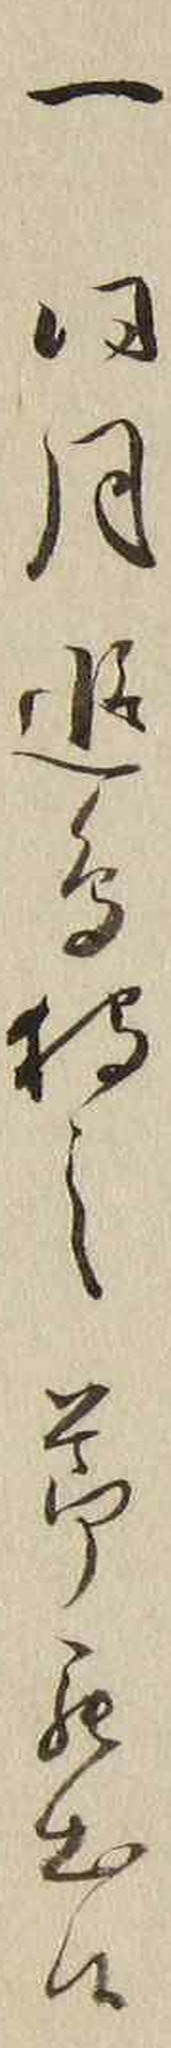一同月追鳥狩之節罷出候
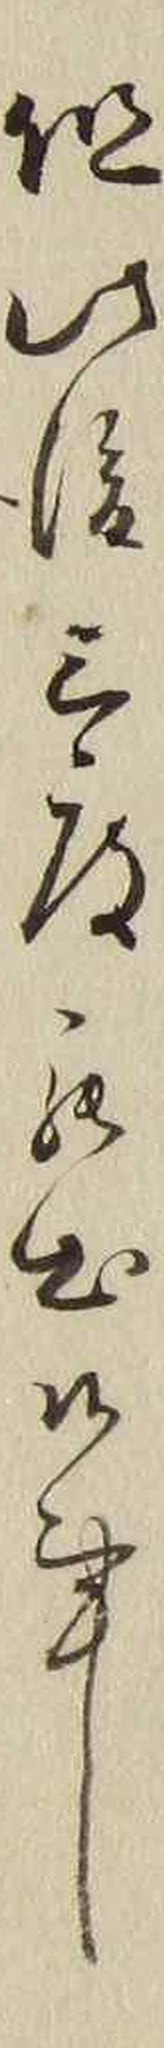但此後三度罷出候事
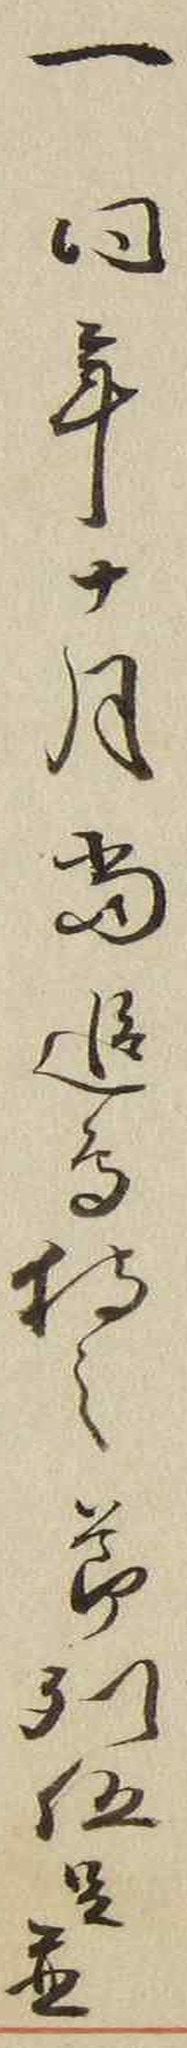一同年十月当追鳥狩之節列伍足並

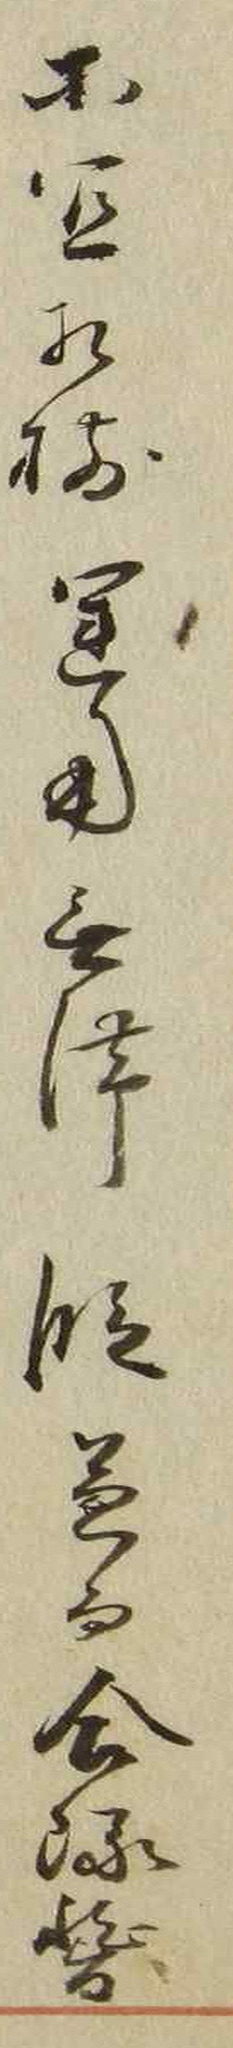等宜相揃運用無滞段兼而合体稽
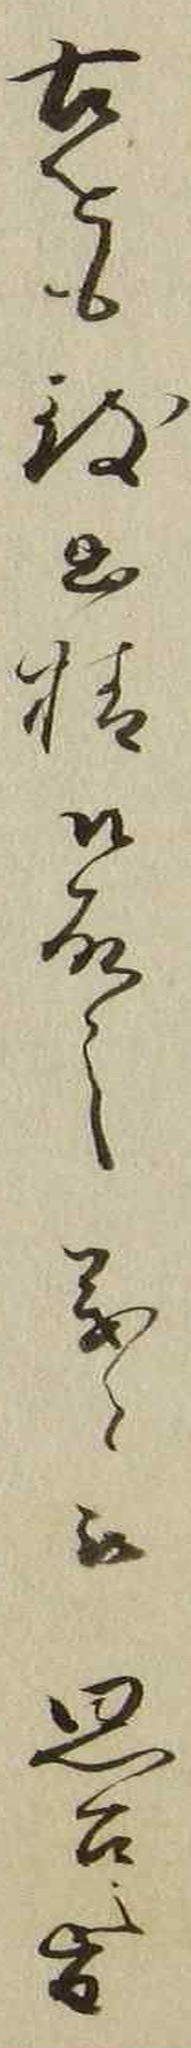古をも致出精候故之義と被思召之旨
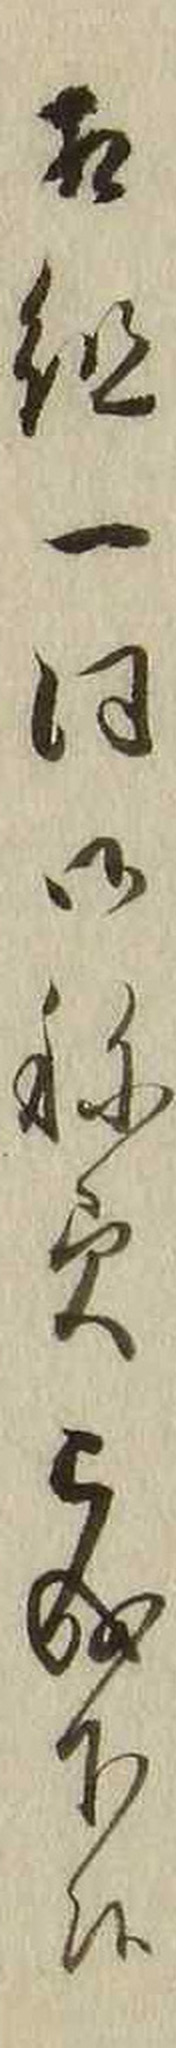相組一同御称美被成下候
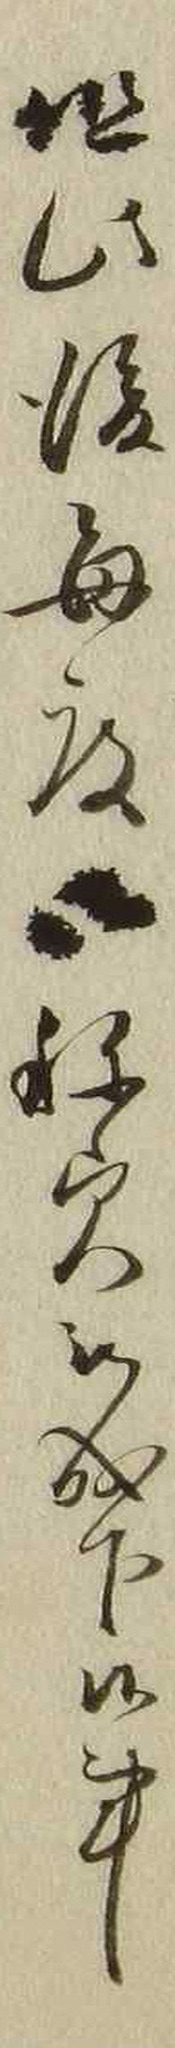但此後毎度御称美被成下候事
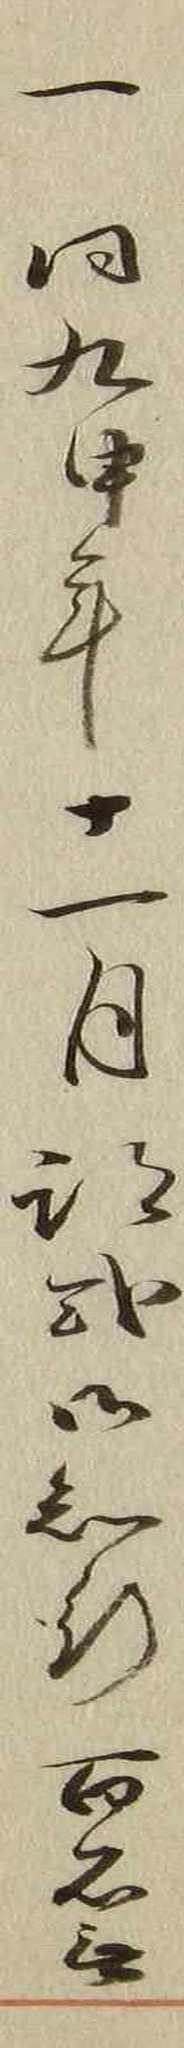一同九申年十一月跡式御知行百石無
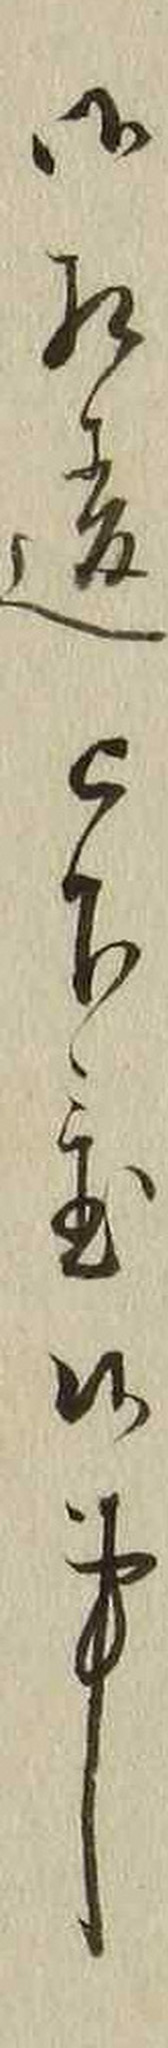御相違被下置候事
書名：諸士系譜　巻之26　い之部26
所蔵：会津若松市立会津図書館
